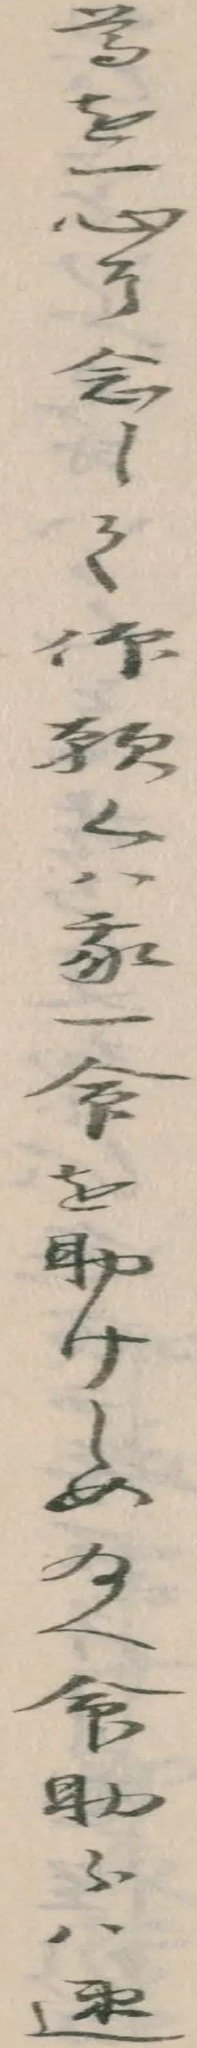尊を一心に念して仰願くは我一命を助けしめ給へ命助らは速
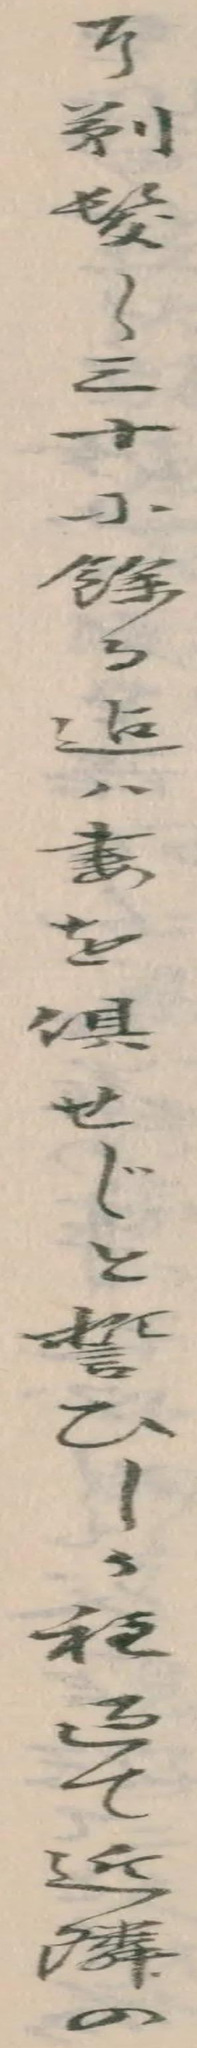に剃髪し三十に余る迄は妻を倶せじと誓ひしか程へて近隣の
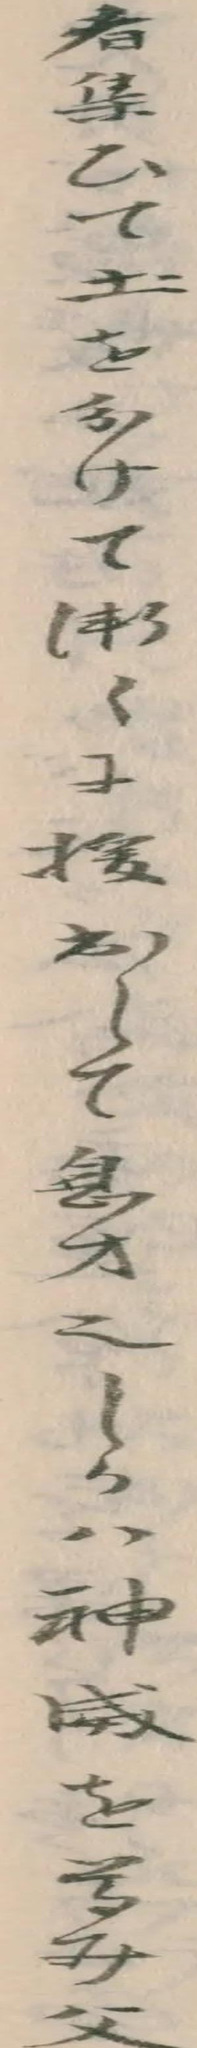者集ひて土を分けて漸くに援出して息才也しかは神威を尊み父
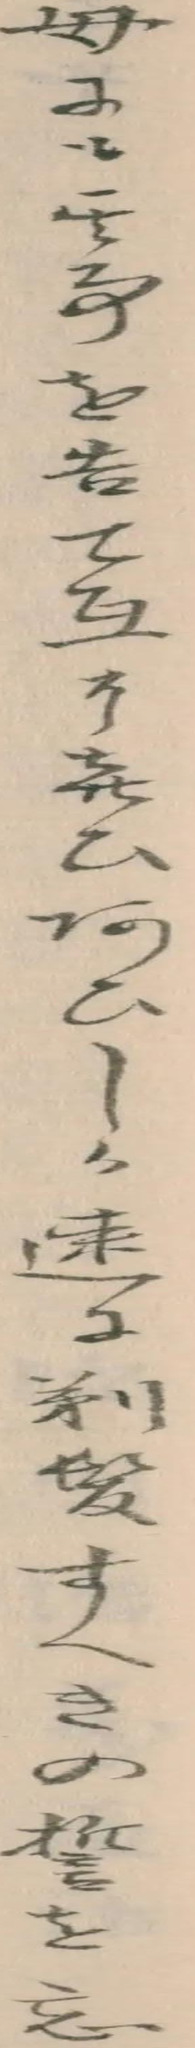母にも其事を告て互に喜ひあひしか速に剃髪すへきの誓を忘
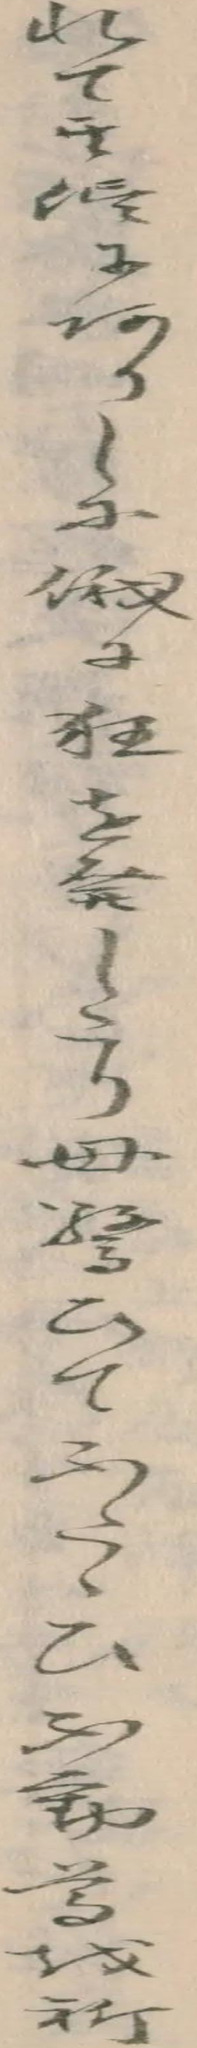れて其侭にありしに俄に狂を発したり母驚ひてふたゝひ不動尊を祈
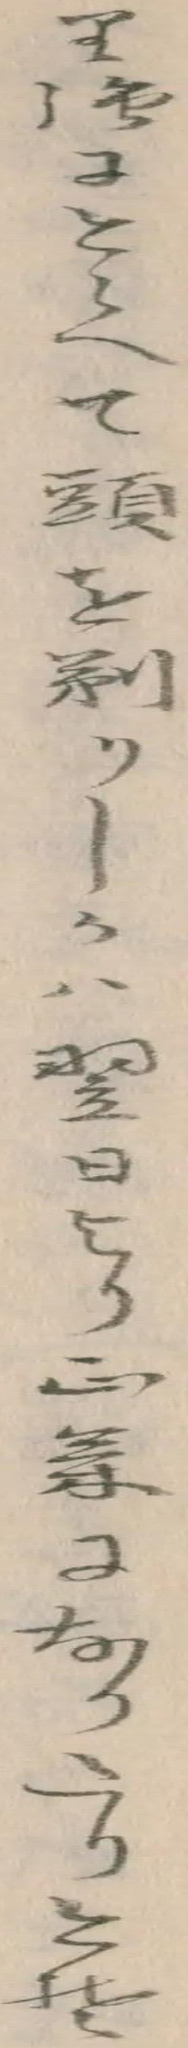り強にとらへて頭を剃りしかは翌日より正気になりたりとそ
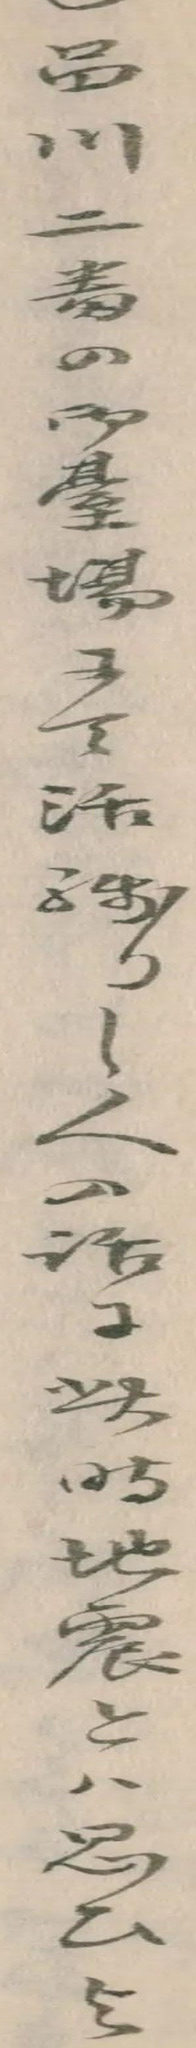〇品川二番の御台場にて活残りし人の話に此時地震とは思ひよ
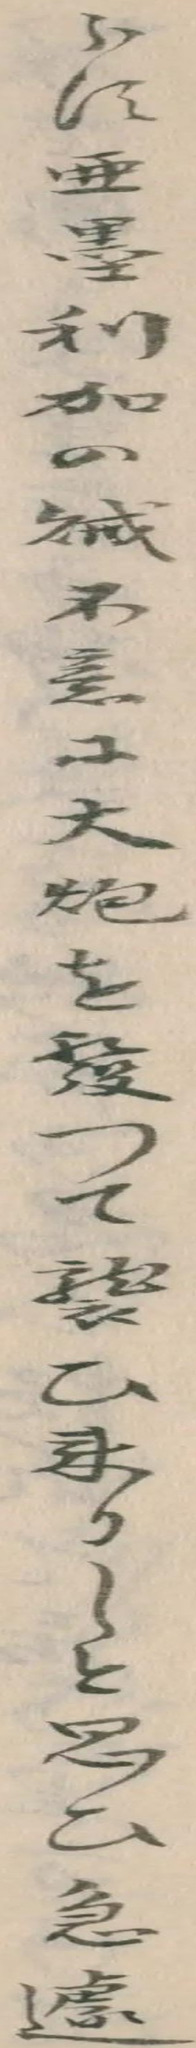らす亜墨利加の賊不意に大炮を発つて襲ひ来りしと思ひ急遽
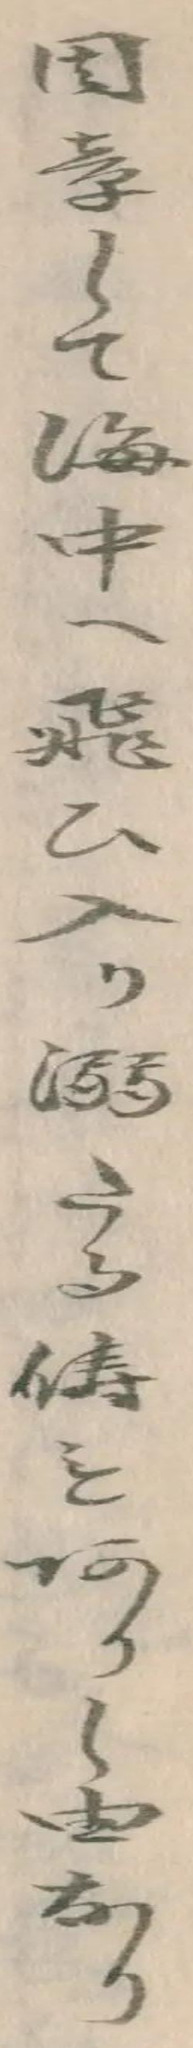周章して海中へ飛ひ入り溺たる儔もありし由なり
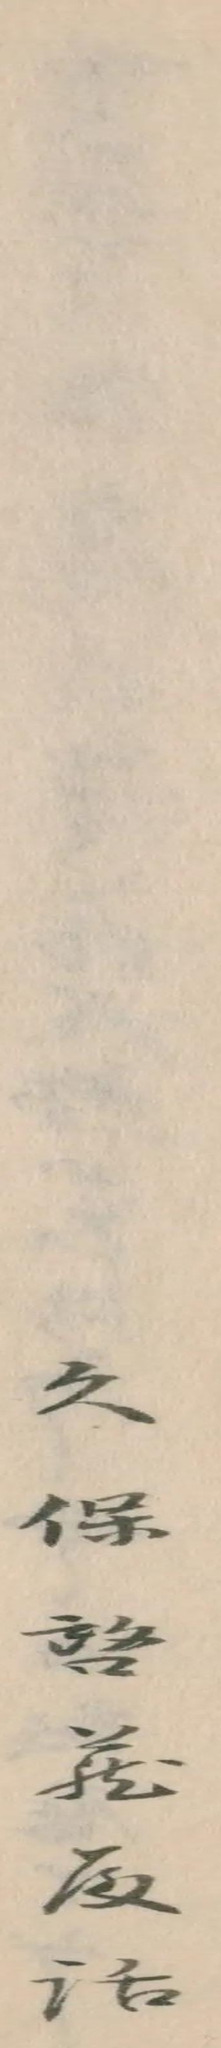久保啓蔵殿話
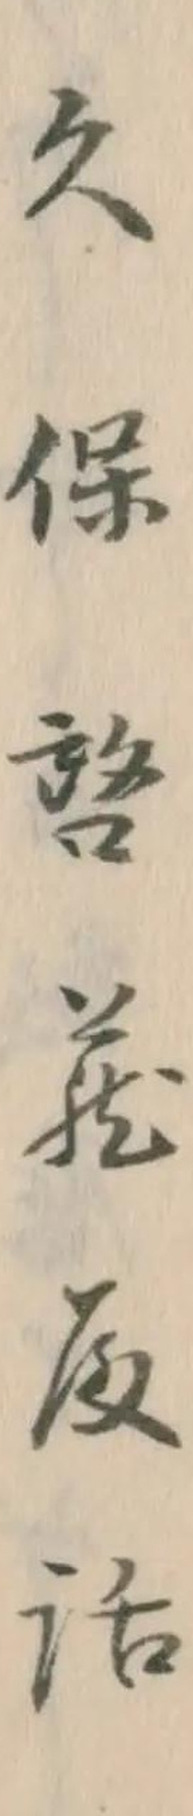久保啓蔵殿話
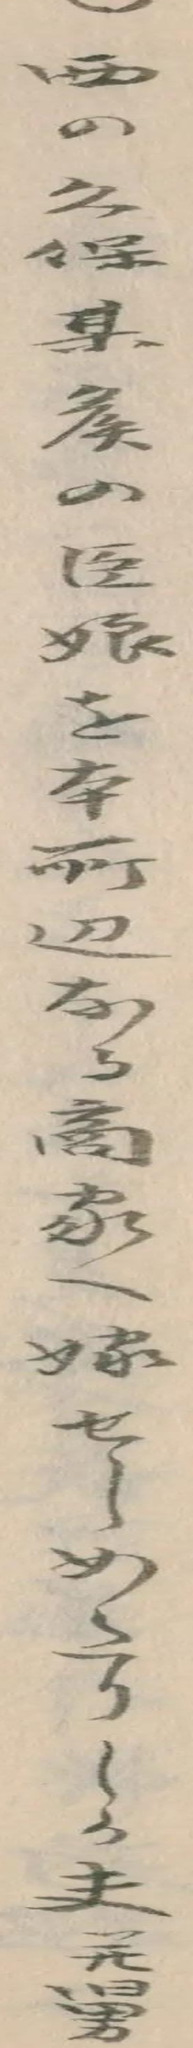〇西の久保某侯の臣娘を本所辺なる商家へ嫁せしめたりしか夫并舅
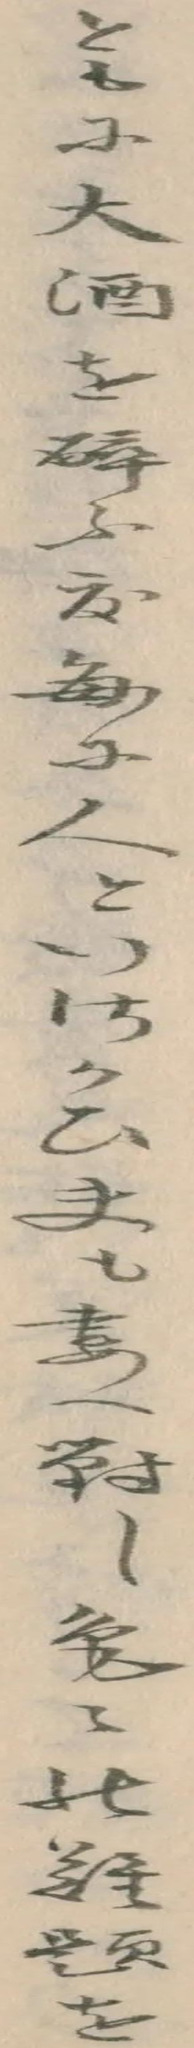ともに大酒を酔ふ度毎に人といさかひ夫も妻へ対し色々の難題を

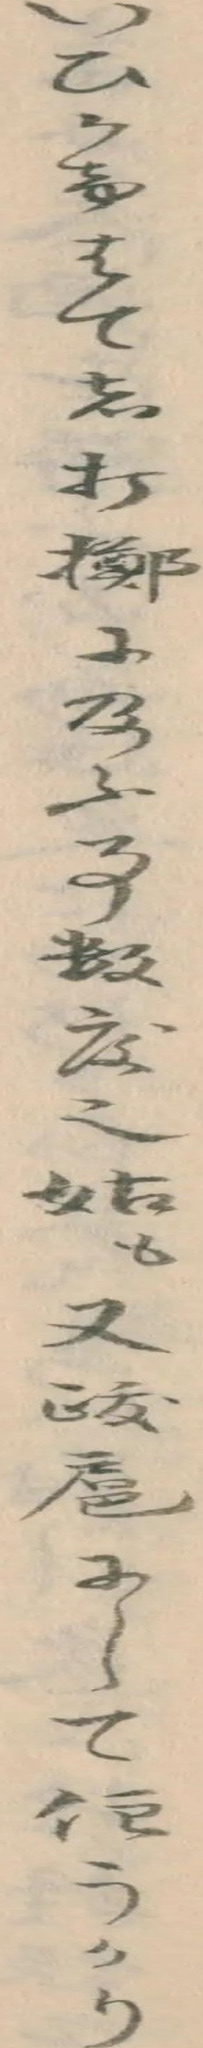いひかけはては打擲に及ふ事数度也姑も又跋扈にして住うかり
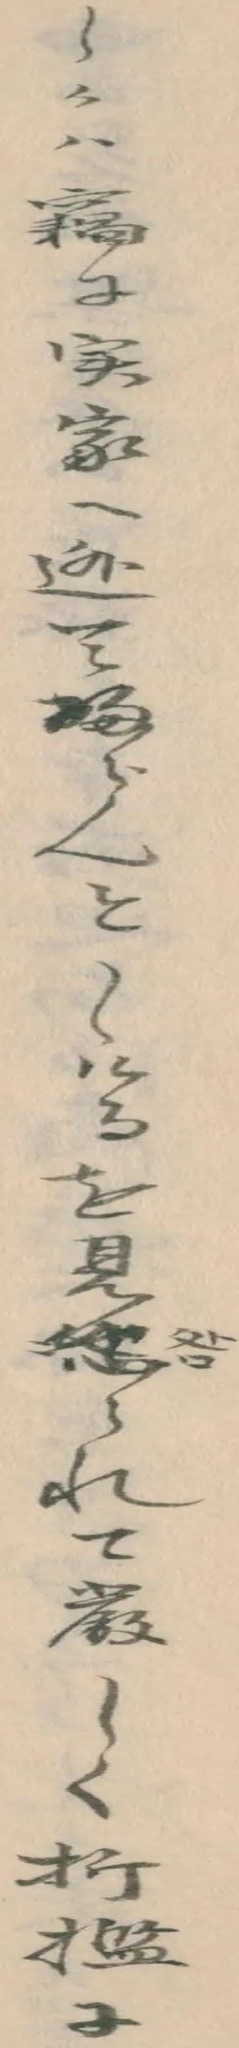しかは窃に実家へ逃て帰らんとしけるを見咎られて厳しく折檻に
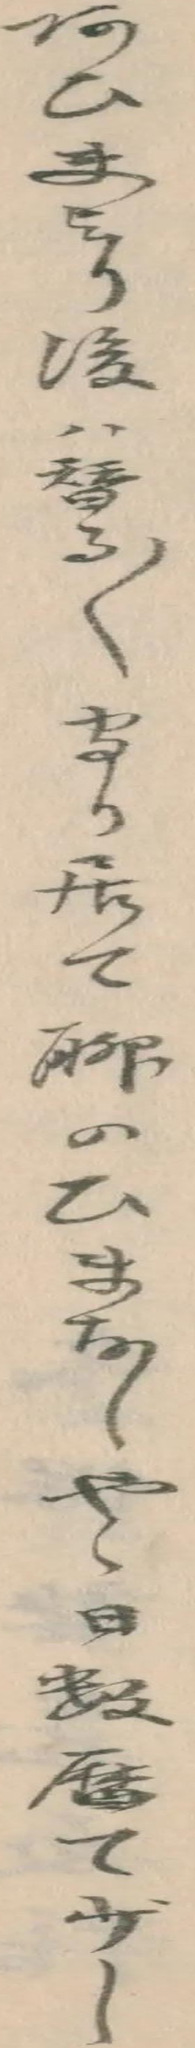あひ夫より後は替る〳〵守り居て聊のひまなしやゝ日数暦て少し
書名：地災撮要. 巻7-9(地震之部)
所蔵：国立国会図書館 National Diet Library, JAPAN
